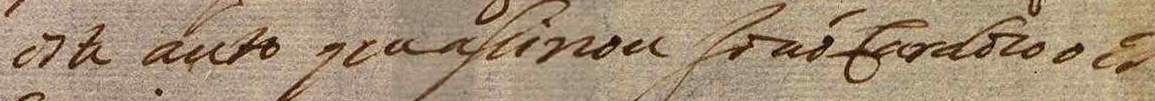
este auto que assinou Joaõ Cardozo o Es
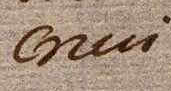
creui
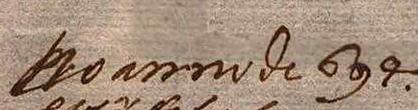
No anno de 694.
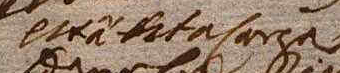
esta dita Carga
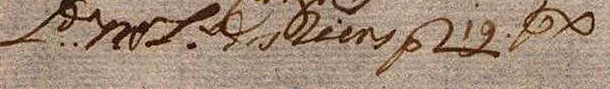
L.da no L.o dos Ricos fl i9. Vso
